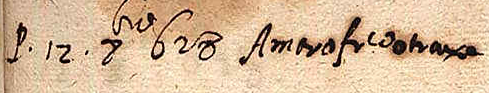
P. 12. 8bro 628 Amaro frco o trouxe
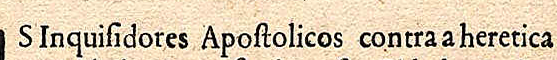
S Inquisidores Apostolicos contra a heretica
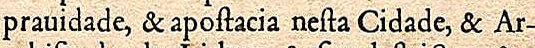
prauidade, & apostacia nesta Cidade, & Ar
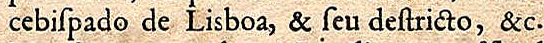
cebispado de Lisboa, & seu destricto, &c.
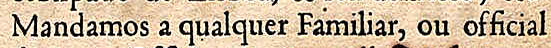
Mandamos a qualquer Familiar, ou official
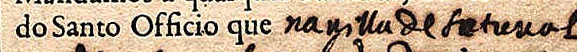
do Santo Officio que na uilla de setuual
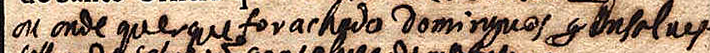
ou onde quer que for achado Dominguos gonsalues
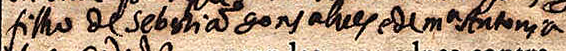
filho de sebastiā gonsalues e de ma Antonia
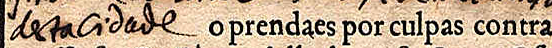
desta cidade o prendaes por culpas contra
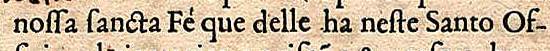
nossa sancta Fé que delle ha neste Santo Of
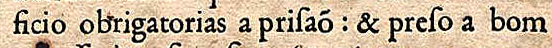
ficio obrigatorias a prisaõ: & preso a bom
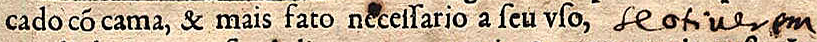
cado cō cama, & mais fato necessario a seu vso, se o tiuer em
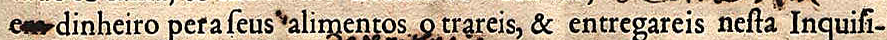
em dinheiro pera seus alimentos o trareis, & entregareis nesta Inquisi
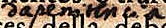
da penitencia
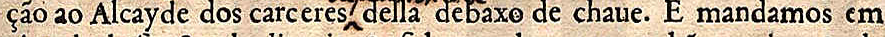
ção ao Alcayde dos carceres della debaxo de chaue. E mandamos em
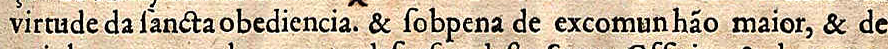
virtude da sancta obediencia. & sob pena de excomunhão maior, & de
